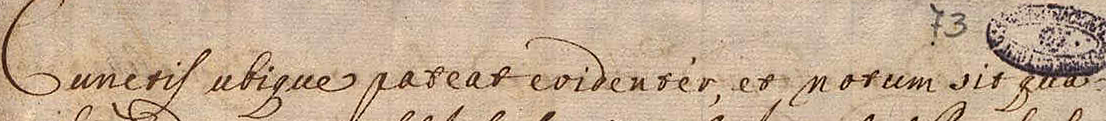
Cunetis ubique pateat evidenter, et, notum sit qua
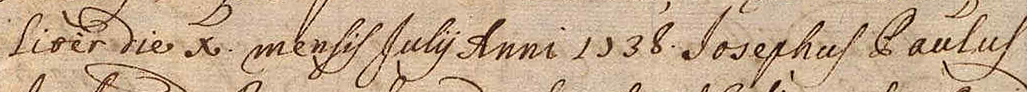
liter die x. mensis Julij Anni 1538 Iosephus Paulus
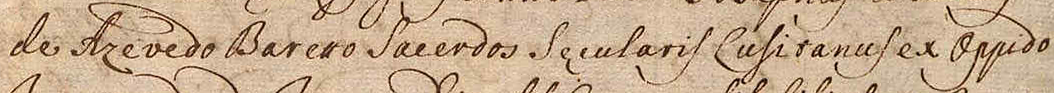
de Azevedo Baretto Sacerdos Sæcularis Lusitanus ex Oppido
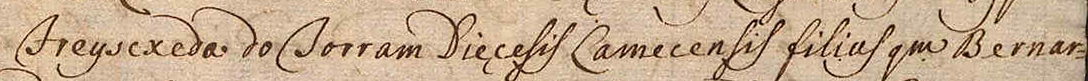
Freysexeda do Torram Diœcesis Lamecensis filius qua Bernar
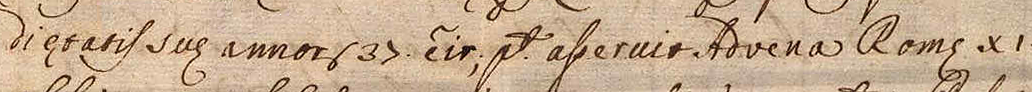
diætatis suæ annor̄ 37. ē ir; pt. asseruit Advena Romæ xi.
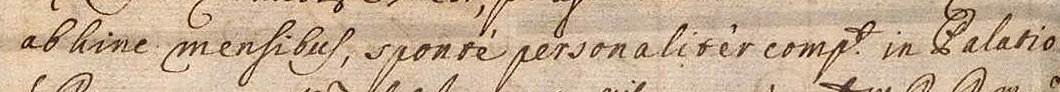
abhine mensibus, spontē personaliter comp.t in Palatio
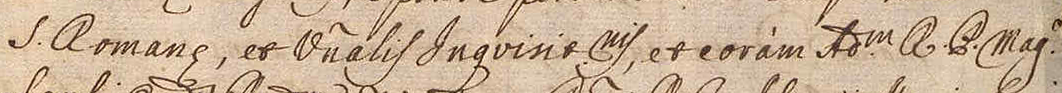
S. Romanæ, et Vūalis Inquisit.nis, et eoram Ad.m R. P. Mag.o
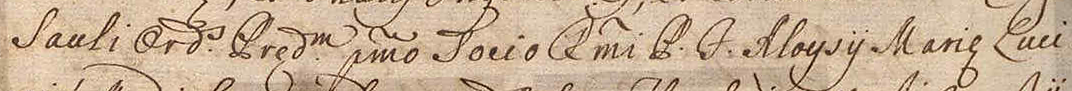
Sauli Ord.s Prædm. pm̄o Socio Rm̄i P. F. Moysij Mariæ Luci
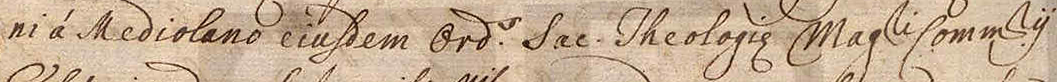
niá Mediolano eiusdem Ord.s Sac. Theologiæ Magri Comm.rij
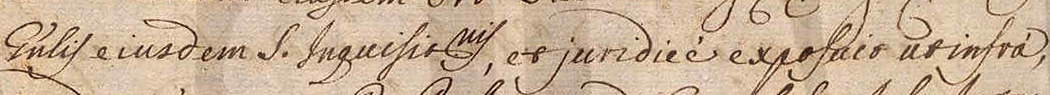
hūlis eiusdem S. Inquisit.nis, et juridicē exposicio ut infra,
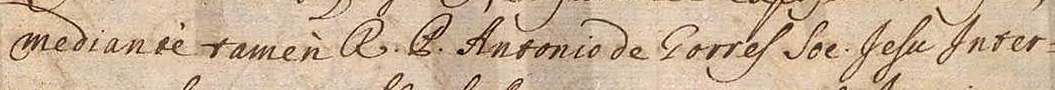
mediantē tamen̄ R. P. Antonio de Torres Soc. Jesu Inter
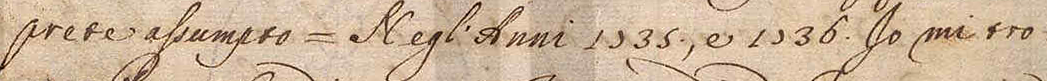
prete assumpto = Negl'Anni 1535., e 1536. Jo mi tro
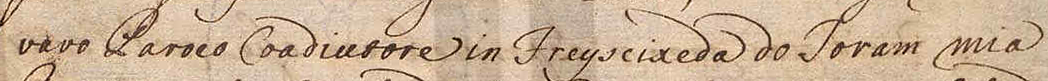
vavo Paroco Coadiutore in Freyseixeda do Toram mia
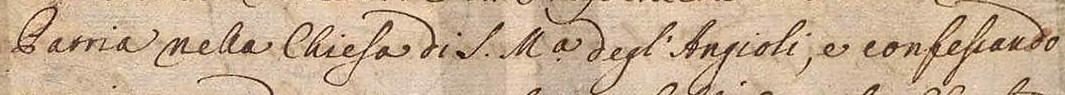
Patria nella Chiesa di S. M.a degl'Angioli, e confessando
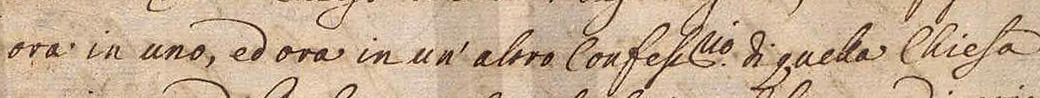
ora in uno, ed ora in un'altro confess.rio di quella Chiesa
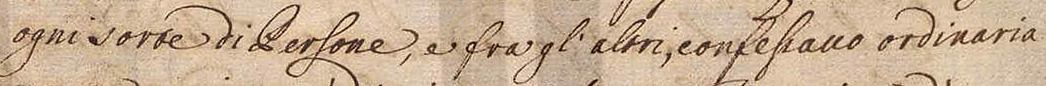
ogni sorte di Persone, e fra gl'altri, confessauo ordinaria
